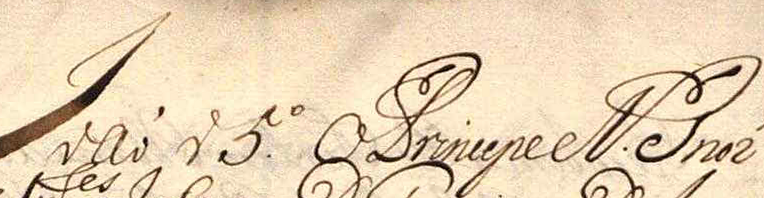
Ioaõ 15.o O Princepe N. Snor̄
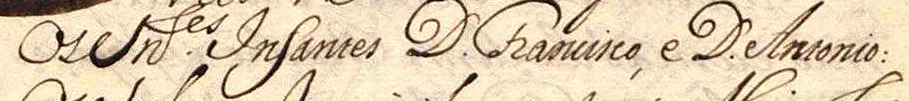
Os sn.res Infantes D. Francisco, e D. Antonio:
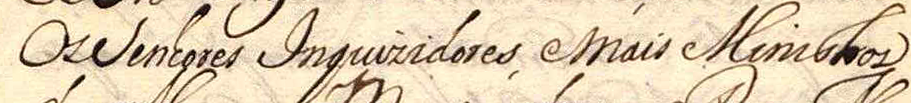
Os Senhores Inquizidores, e mais Menistroz,
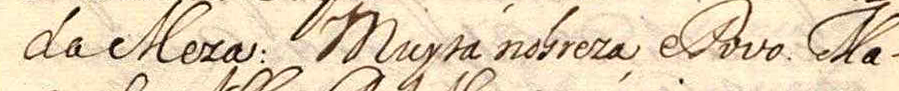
da Meza: Muyta nobreza, e Povo Ma
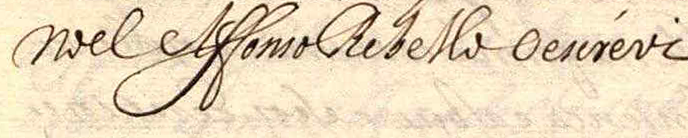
noel Affonso Rebello o escrevi
